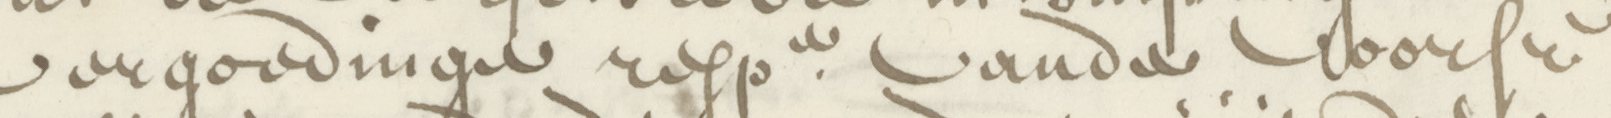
vergoedinge respe vande voorsre
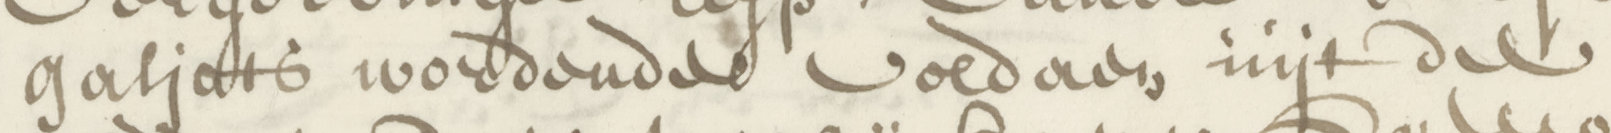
galjots wordende voldaen uijt de
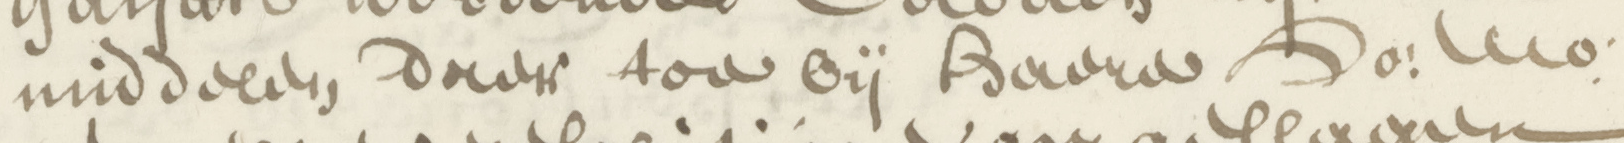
middelen daer toe bi haere Ho:Mo:
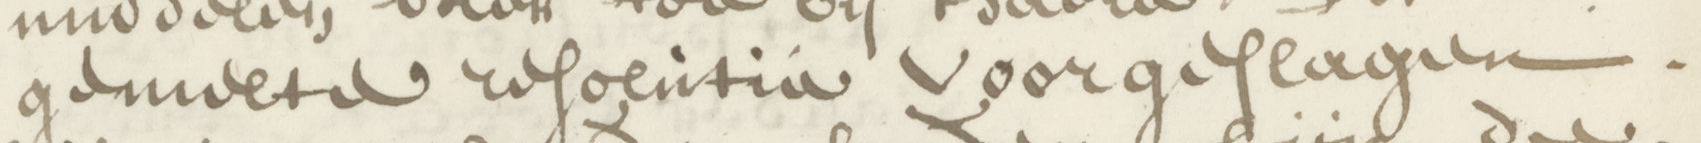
gemelte resolutie voorgeslagen
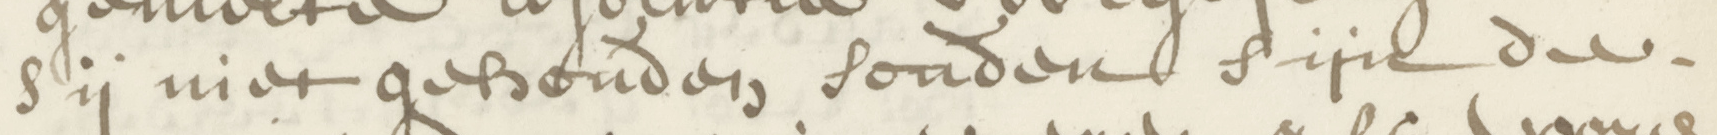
sij niet gehouden souden sijn de
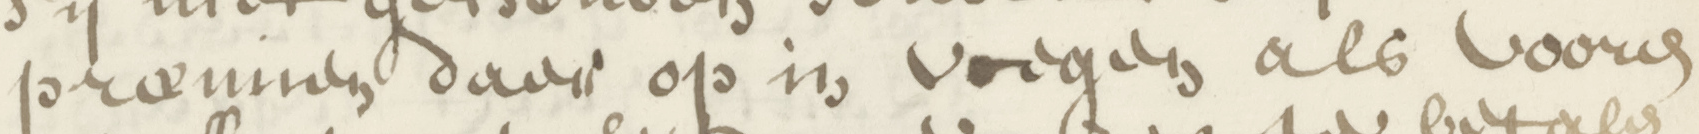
præmien daer op in voegen als vooren
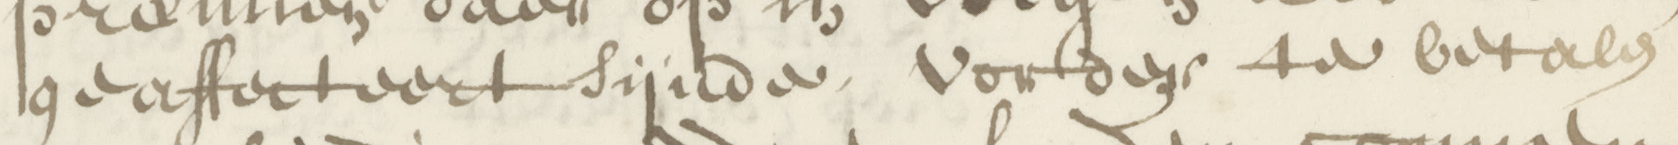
geaffecteert sijnde, vorder te betalen
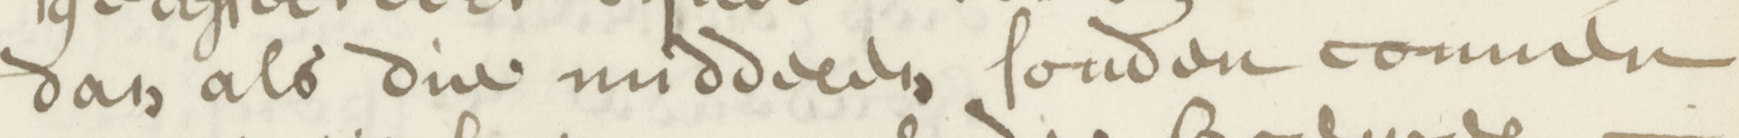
dan als die middelen souden connen
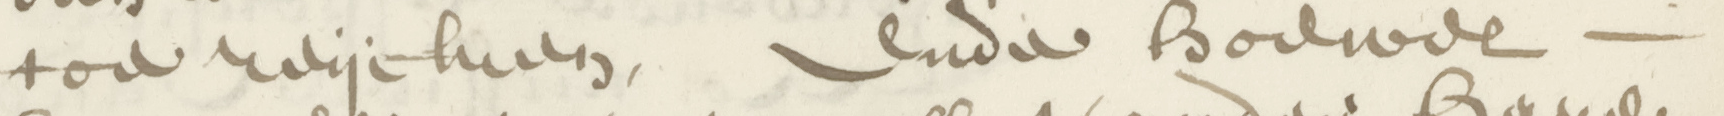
toe reijcken. Ende hoewel —
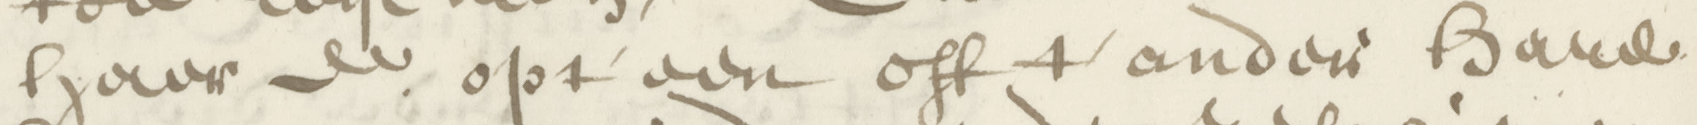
haer E. opt een off t'ander hare
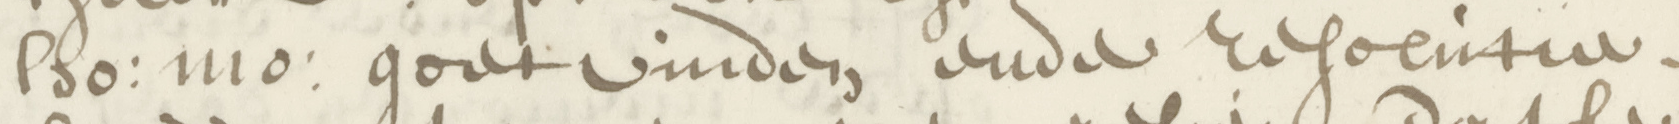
Ho:Mo: goetvinden ende resolutie
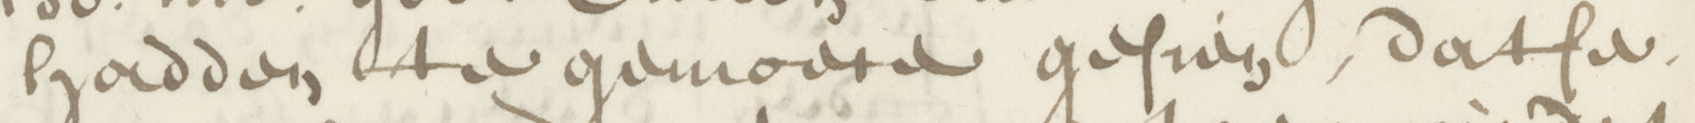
hadden te gemoete gesien, datse
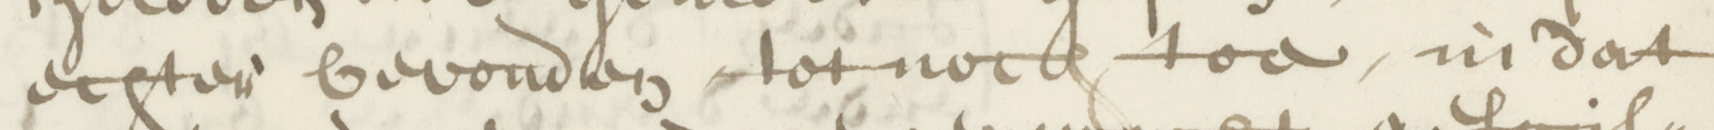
echter bevonden tot noch toe, in dat
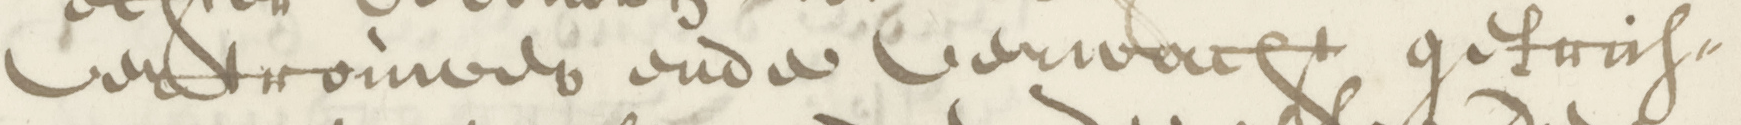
vertrouwen ende verwacht gefrus„
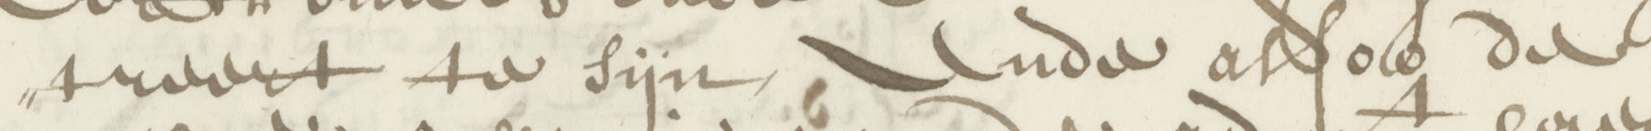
treert te sijn. Ende alsoo de
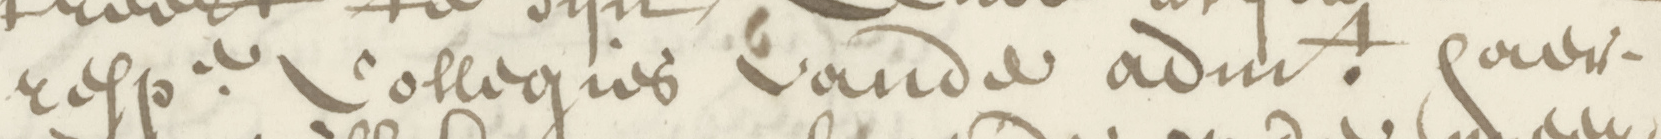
respe Collegies vande Admt. haer
